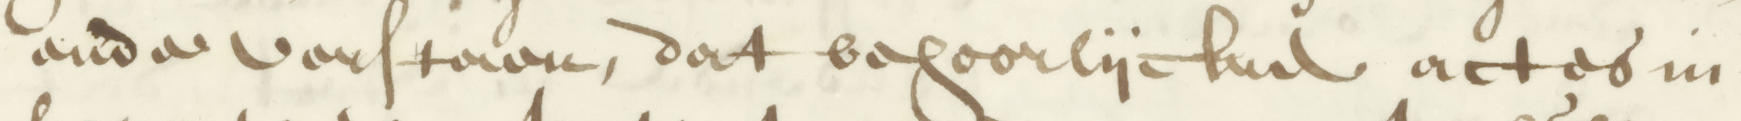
ende verstaen, dat behoorlijcke actes in
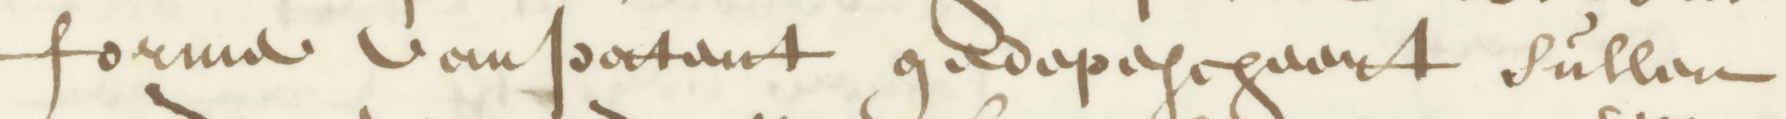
forme van patent gedepescheert sullen
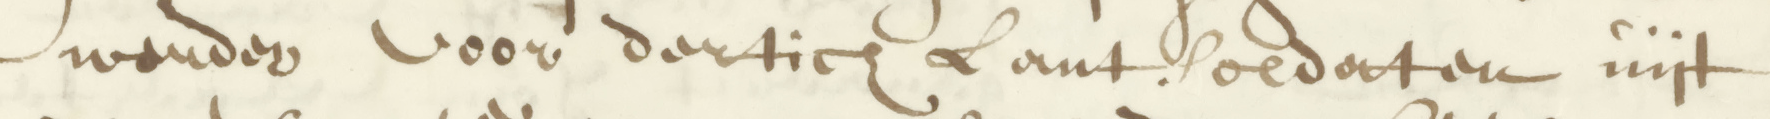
werden voor dertich Lant soldaten uijt
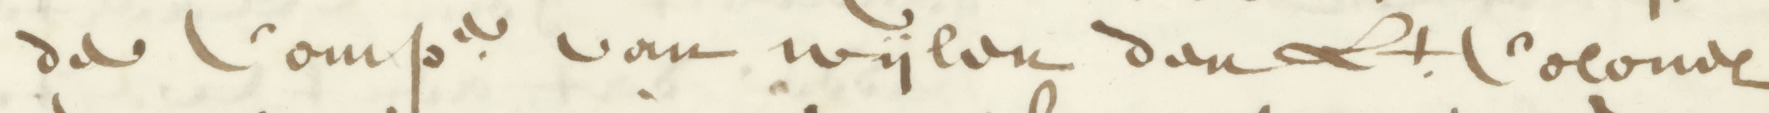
de Compe van wijlen den Lt. Colonel
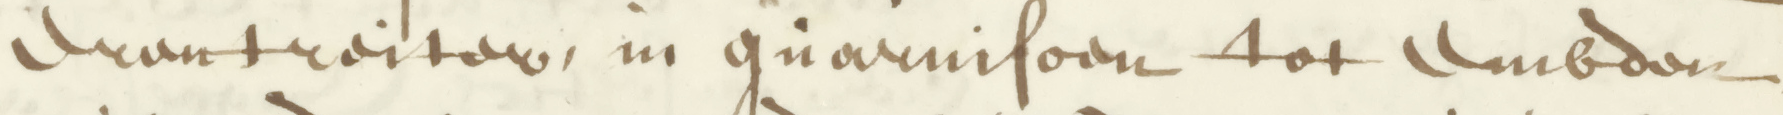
Erentreiter, in guarnisoen tot Embden
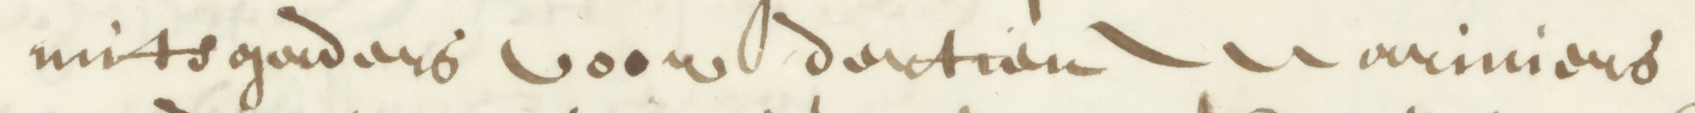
mitsgaders voor dertien mariniers
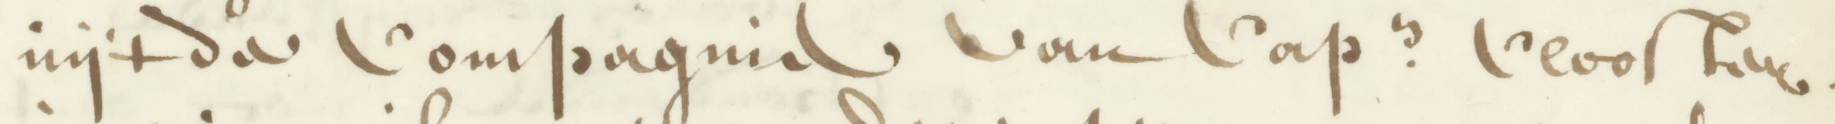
uijt de Compagnie van Capn Clooster
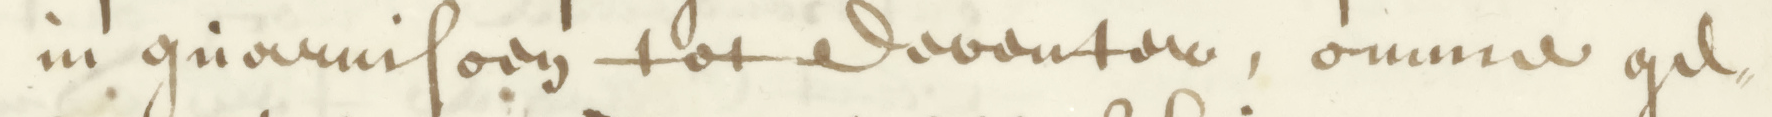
in guarnisoen tot Deventer, omme ge„
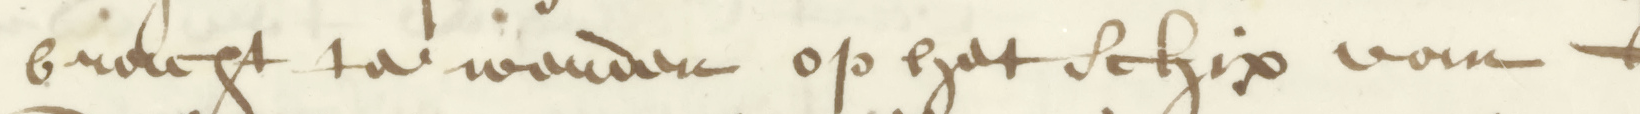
bracht te werden op het schip van
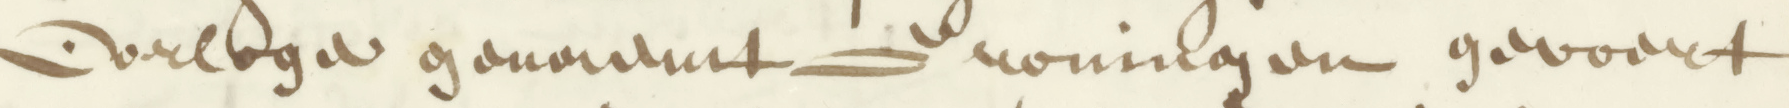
Oorloge genaemt Groningen gevoert
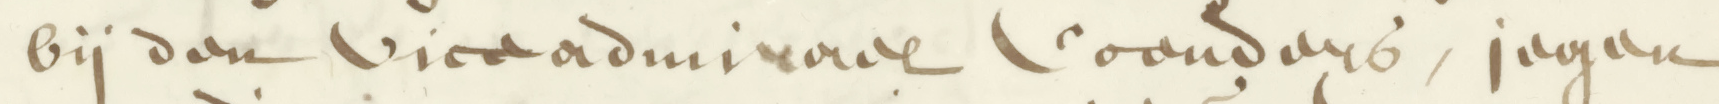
bij den vice admirael Coenders, jegen
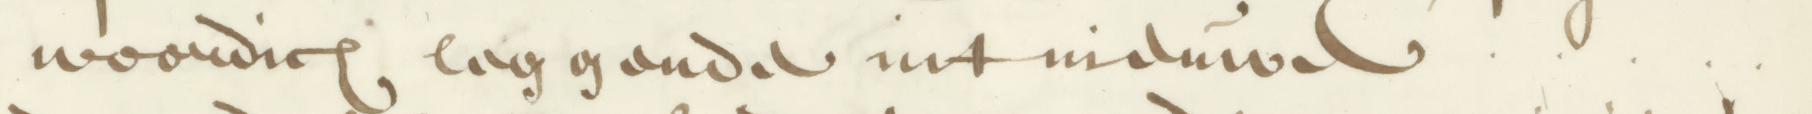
woordich leggende int nieuwe .....
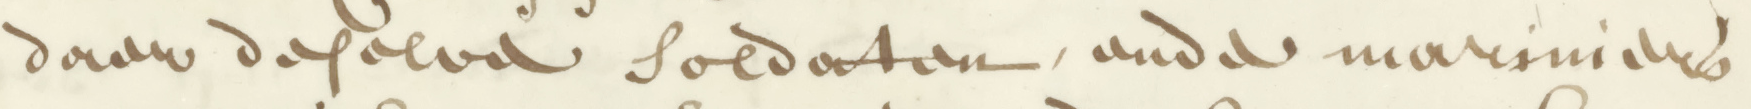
daer deselve soldaten ende mariniers
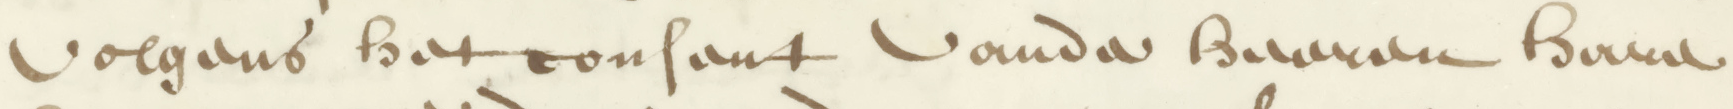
volgens het consent vande heeren hare
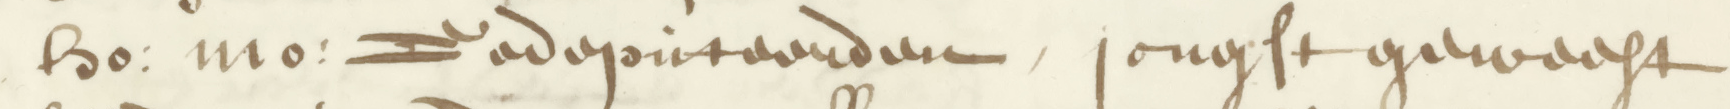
Ho: Mo: Gedeputeerden, jongst geweest
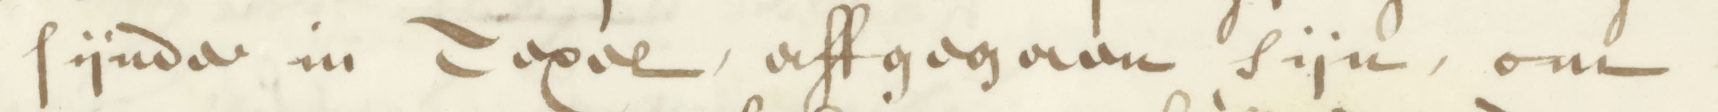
sijnde in Texel, affgegaen sijn, om
